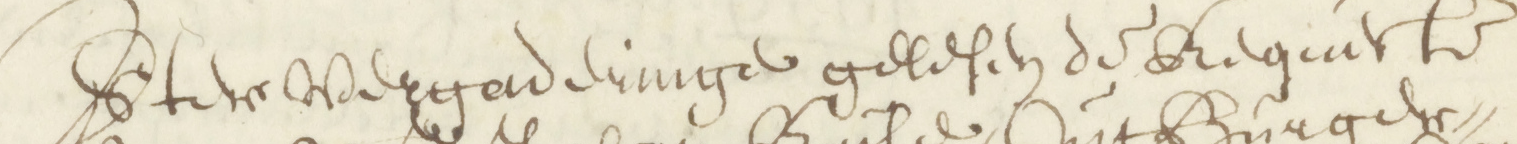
Is ter Vergaderinge gelesen de Requeste
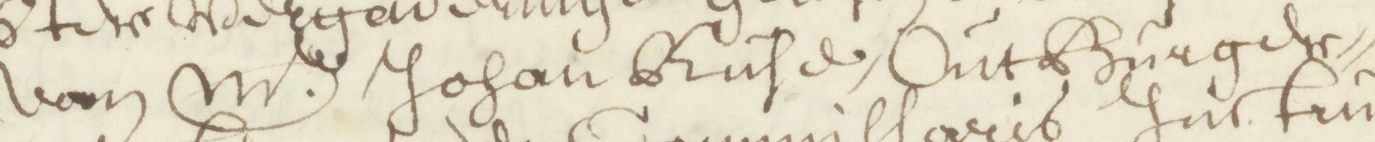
van Mr. Johan Ruse, OutBurger„
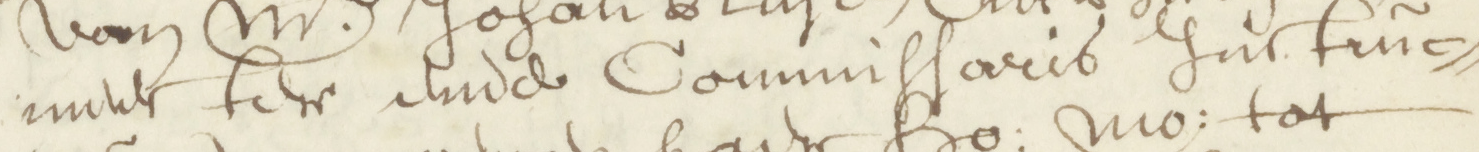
meester ende Commissaris Instruc„
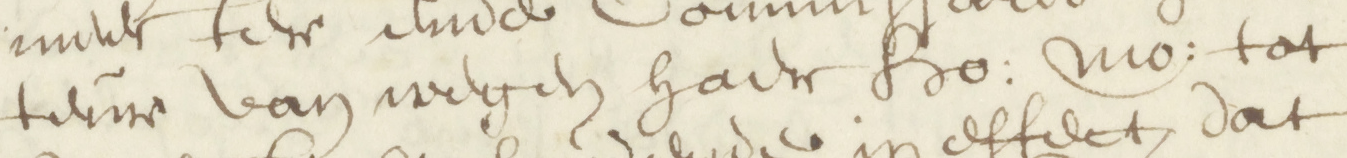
teur van wegen haer Ho:Mo: tot
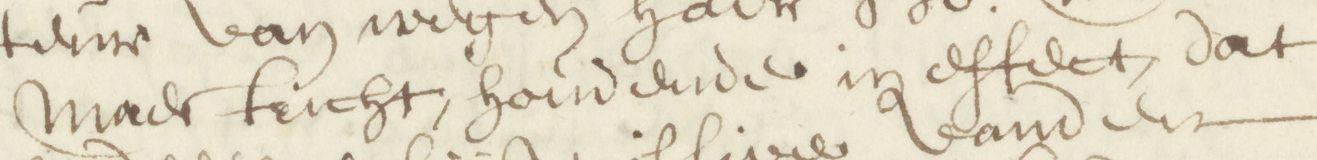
Maestricht, houdende in effect, dat
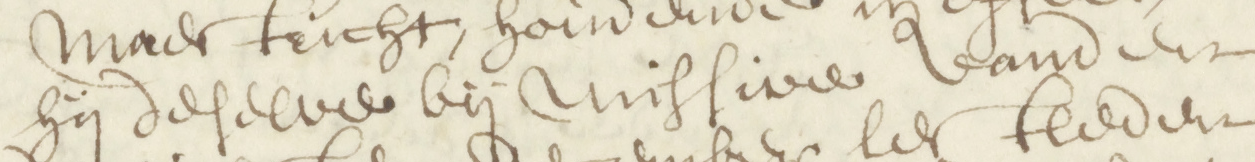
hij deselve bij missive vanden
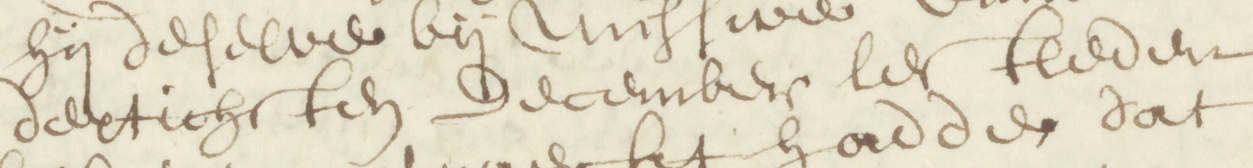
dertichsten December lestleden
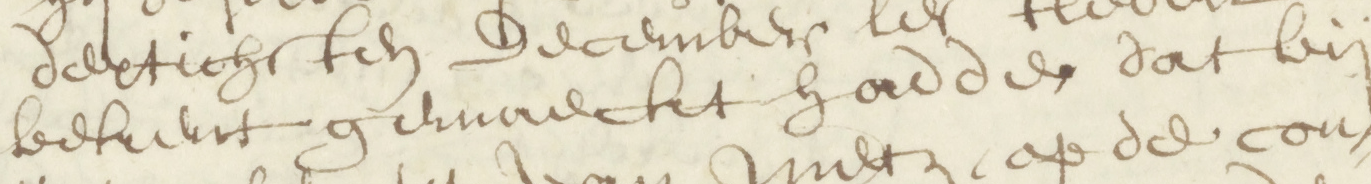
bekent gemaeckt hadde dat bij
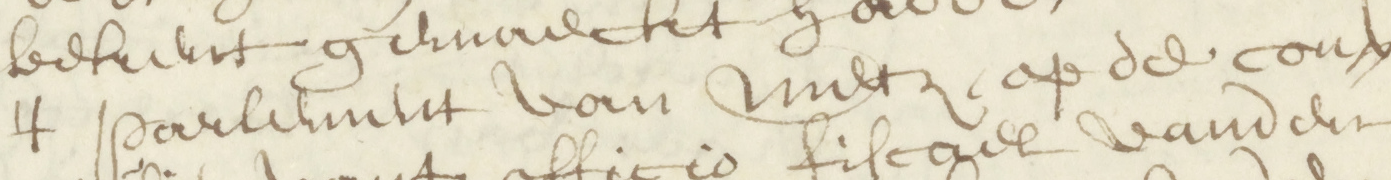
't Parlement van Metz, op de con„
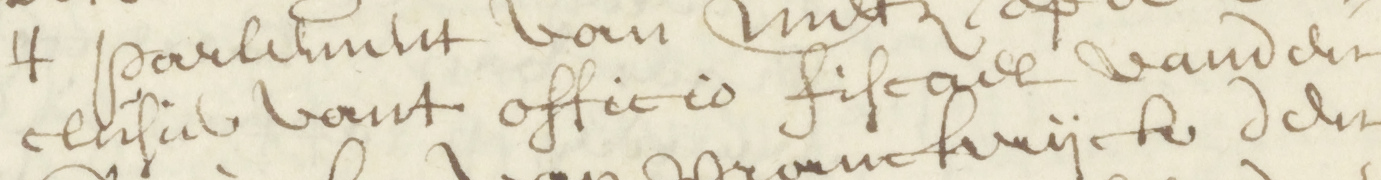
clusie vant officio fiscael vanden
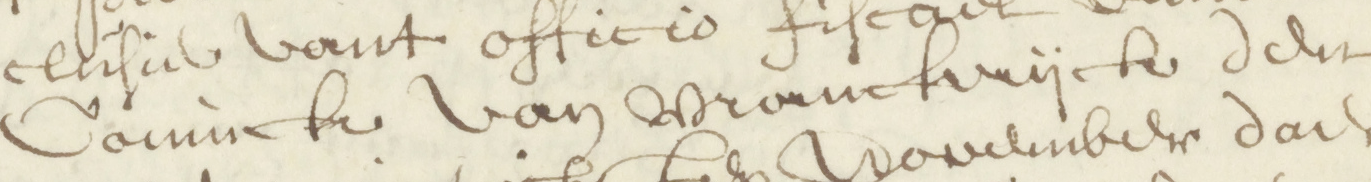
Coninck van Vranckrijck den
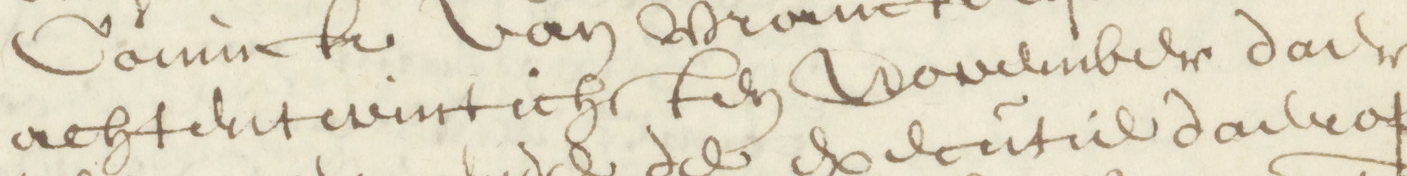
achtentwintichsten November daer
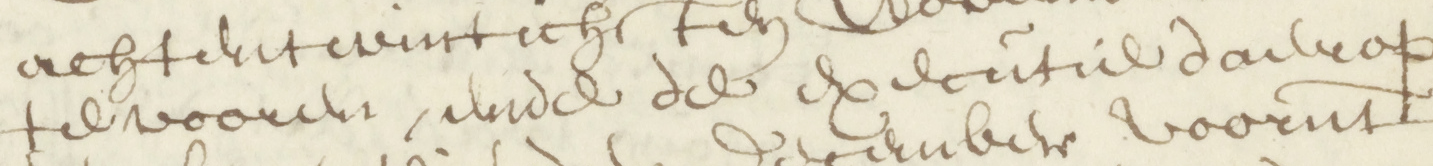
te vooren, ende de executie daerop
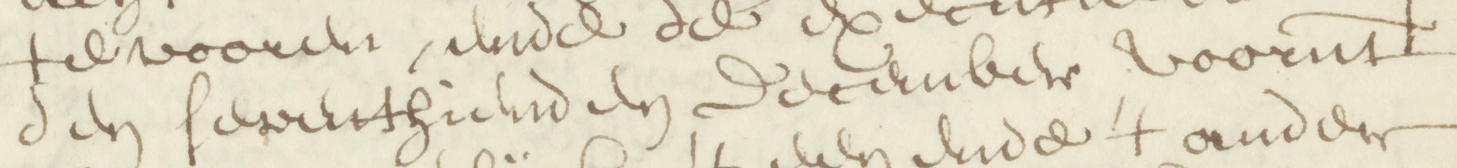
den seventhienden December voornt
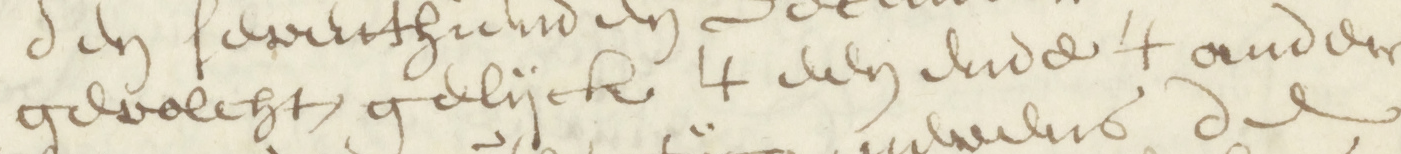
gevolcht, gelijck 't een ende 't ander
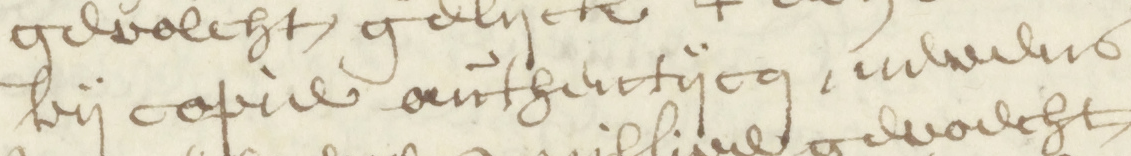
bij copie authentijcq, nevens de
